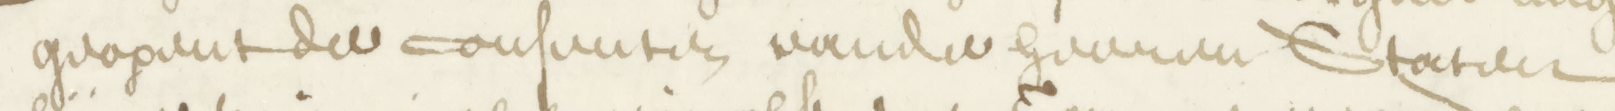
geopent de consenten vande heeren Staten
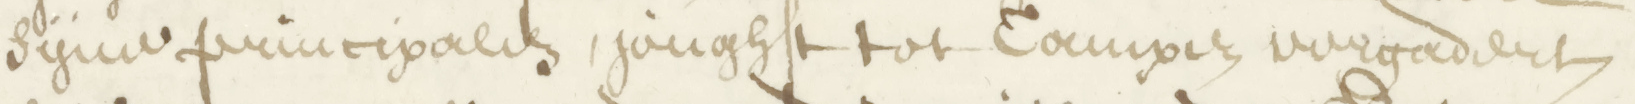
sijne principalen, jonghst tot Campen vergadert,
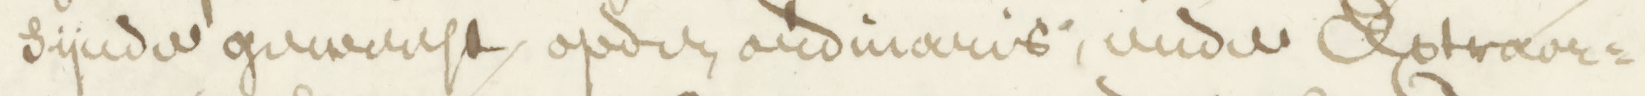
sijnde geweest, opden ordinaris, ende Extraor„
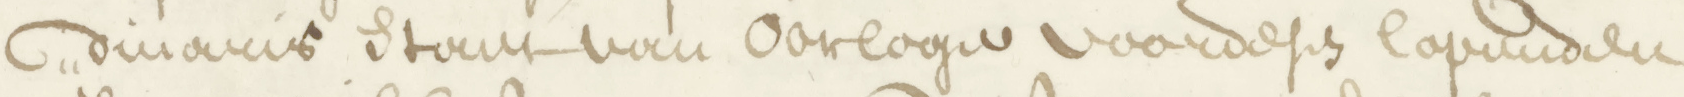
„dinaris Staet van Oorloge voordesen lopenden
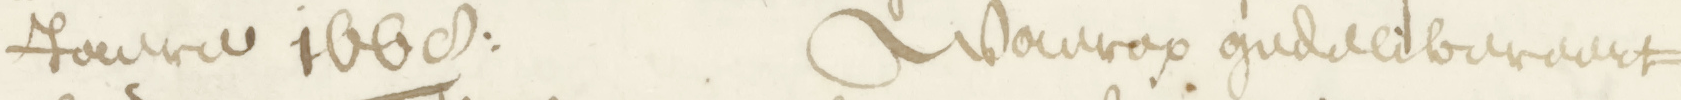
Jaere 1668: Waerop gedelibereert
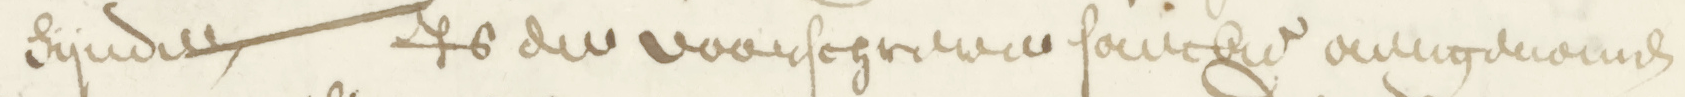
sijnde, Is de voorschreve saecke aengenomen
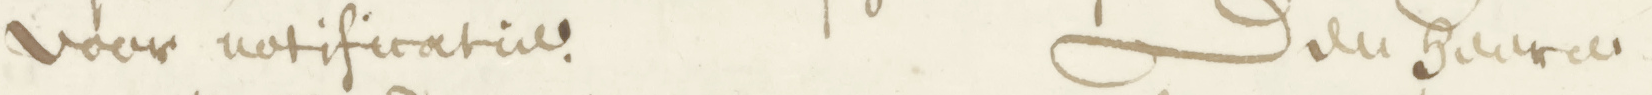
voor notificatie. Den heere
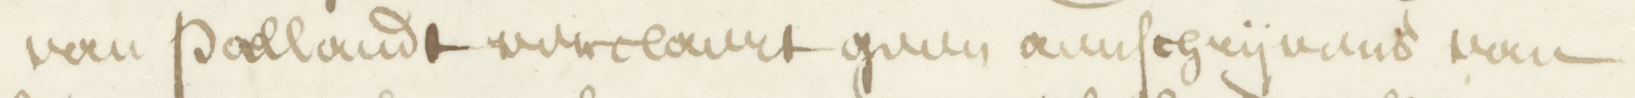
van Pallandt verclaert geen aenschrijvens van
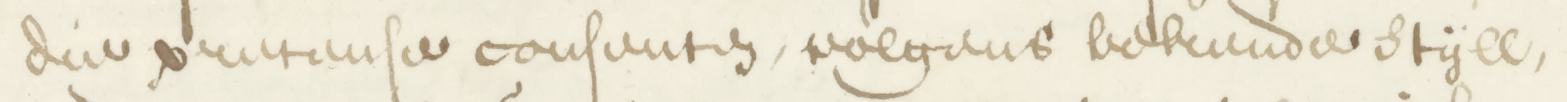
die pretense consenten, volgens bekende stijll,
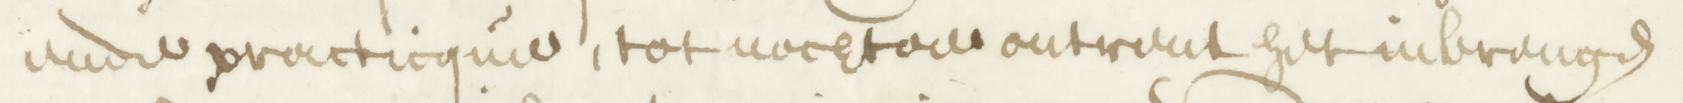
ende practicque, tot nochtoe ontrent het inbrengen
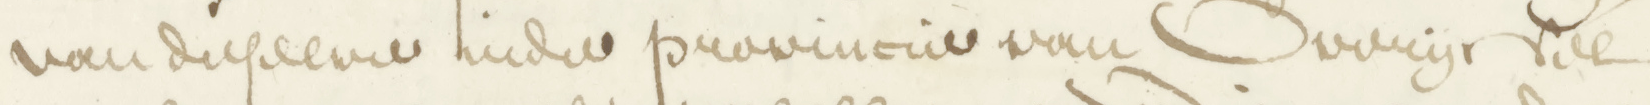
van deselve inde provincie van Overijssel
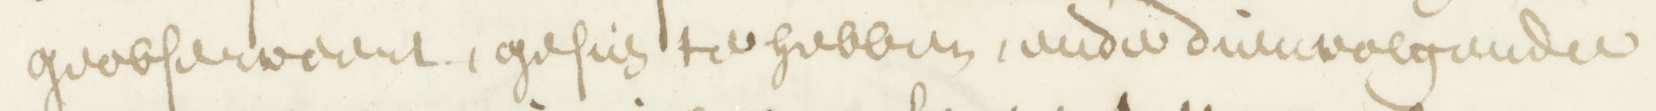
geobserveert, gesien te hebben, ende dienvolgende
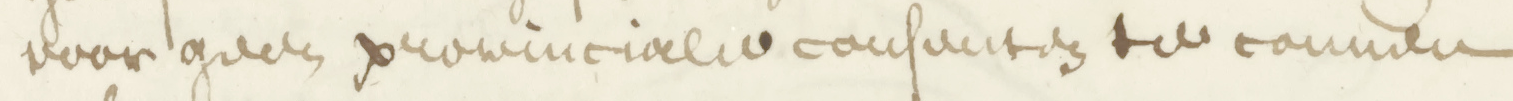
voor geen provinciale consenten te connen
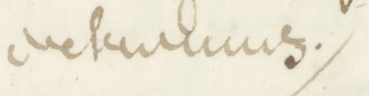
erkennen.
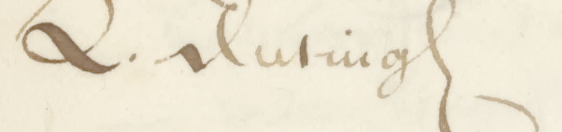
L. Entingh
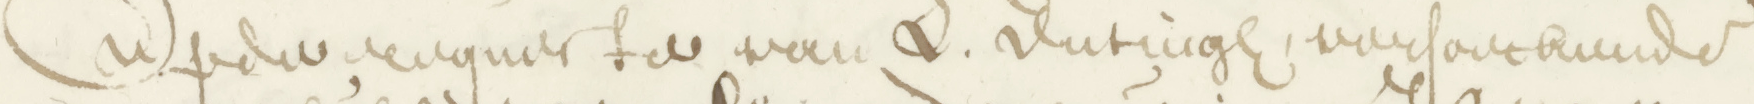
Opde requeste van L. Entingh, versoeckende
